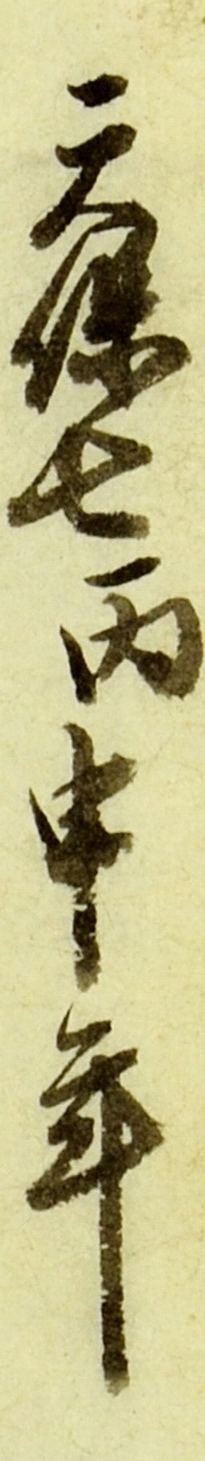天保七丙申年
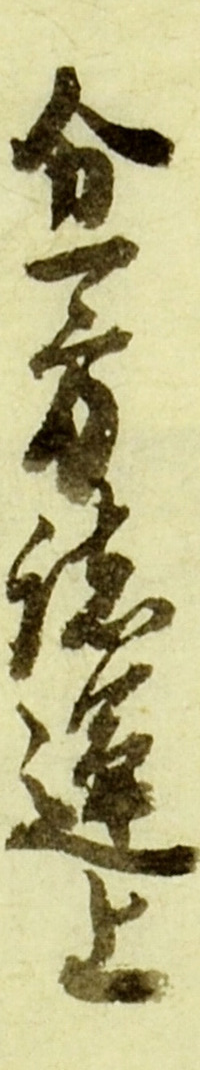分一方諸運上
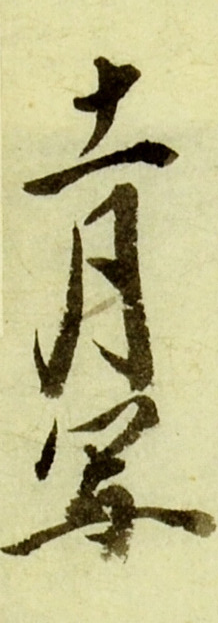十一月写
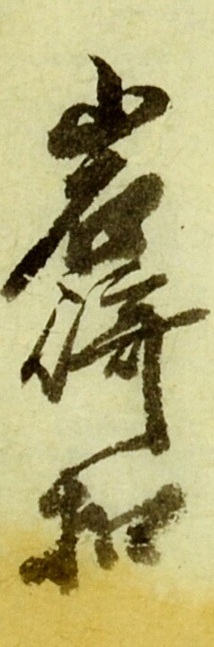岩崎扣

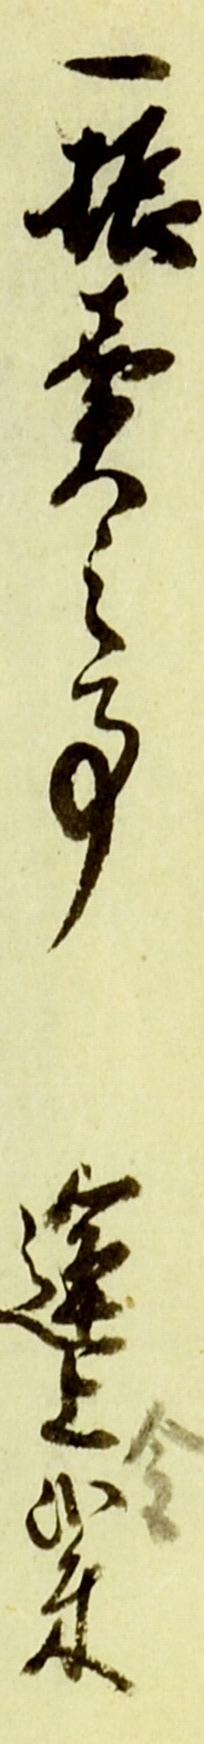一振売之事運上弐朱
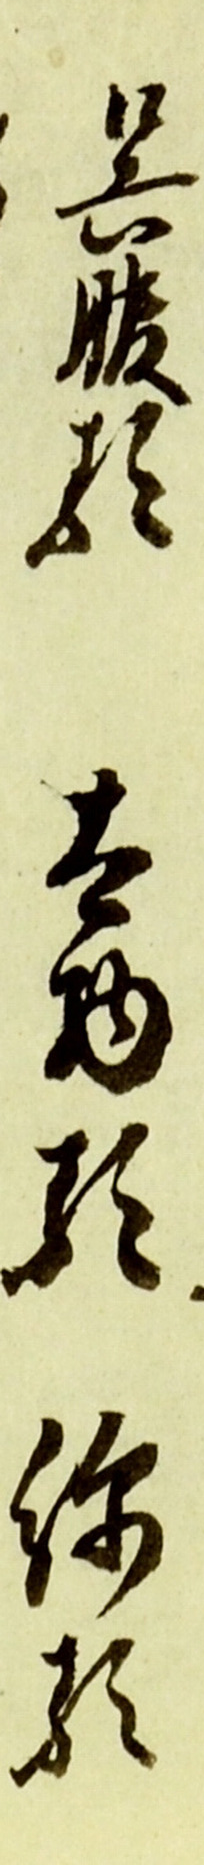呉服類太物類綿類
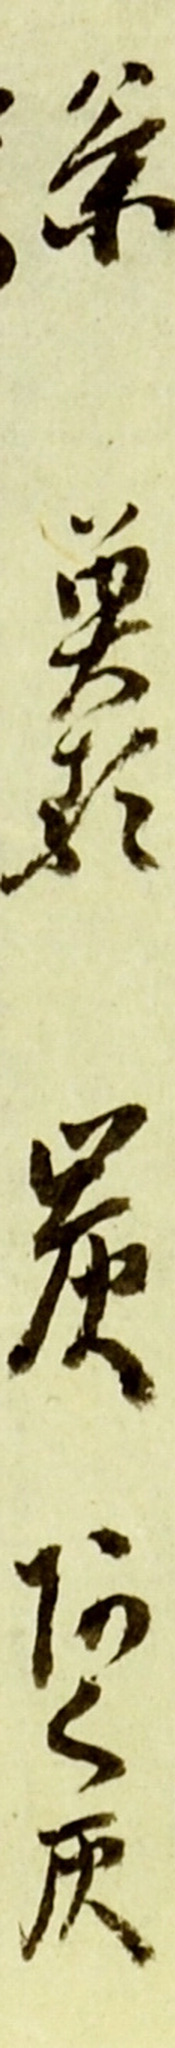茶魚類炭あく灰
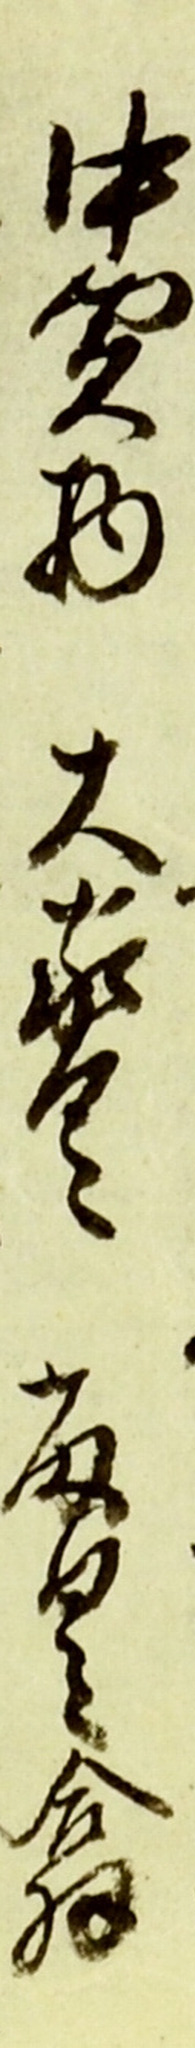中買物大家具雨具合羽
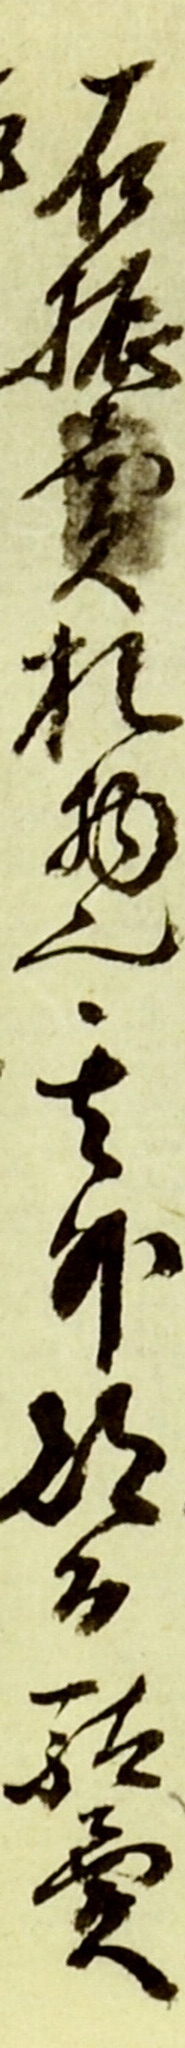右振売札物也其外都而駄売
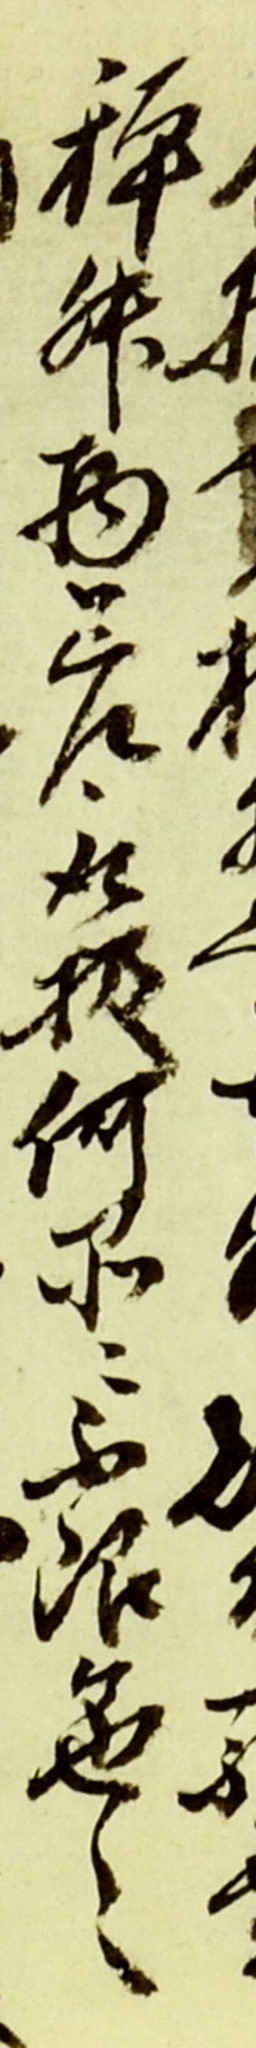秤升者差取扱何品ニ不限色々
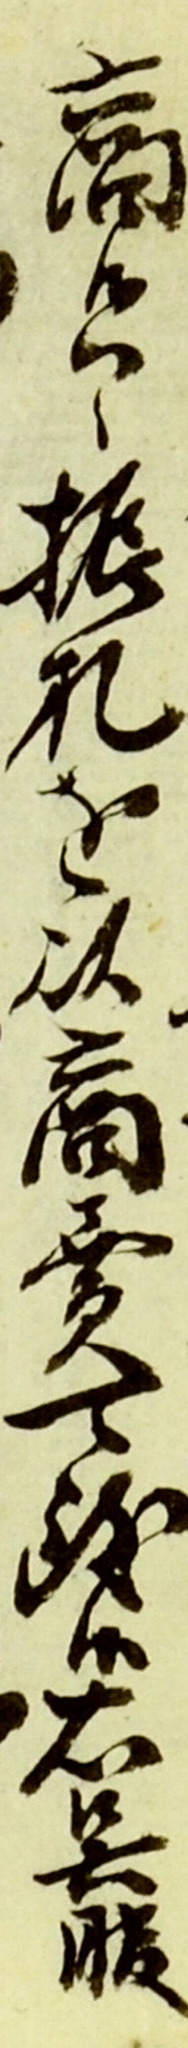商候ハゝ振札を以商売可致候右呉服
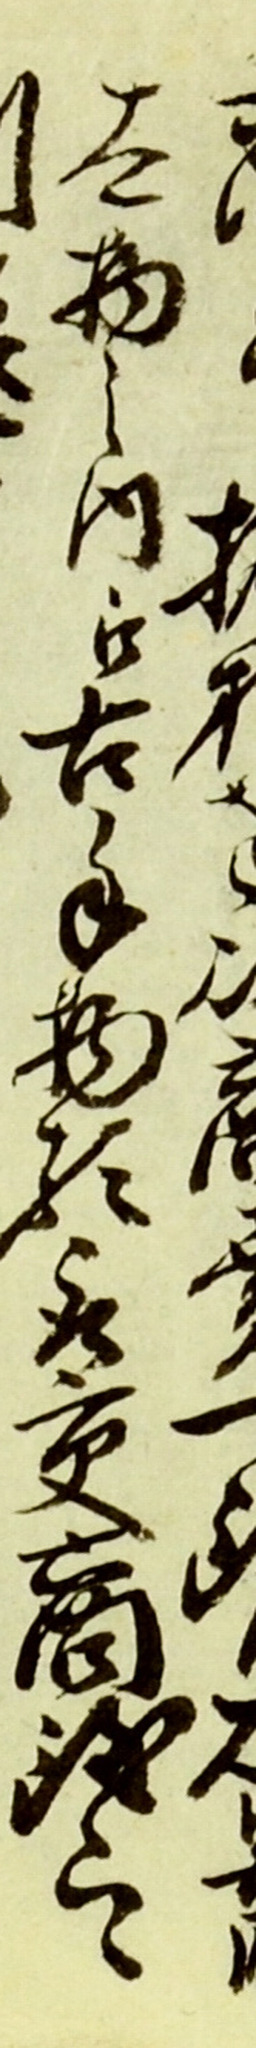太物之内江古手物類取交商致候ハゝ
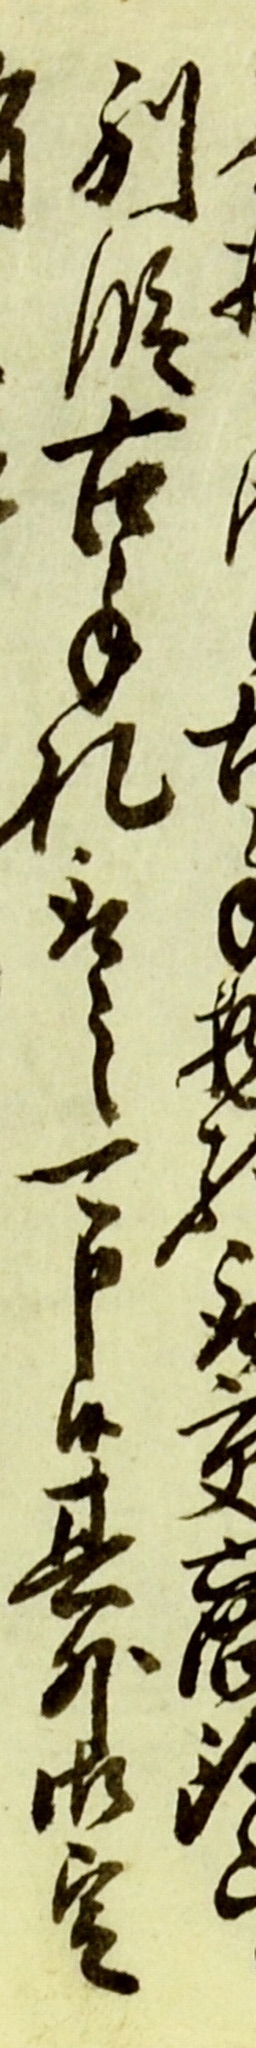別段古手札取之可申候其外御定
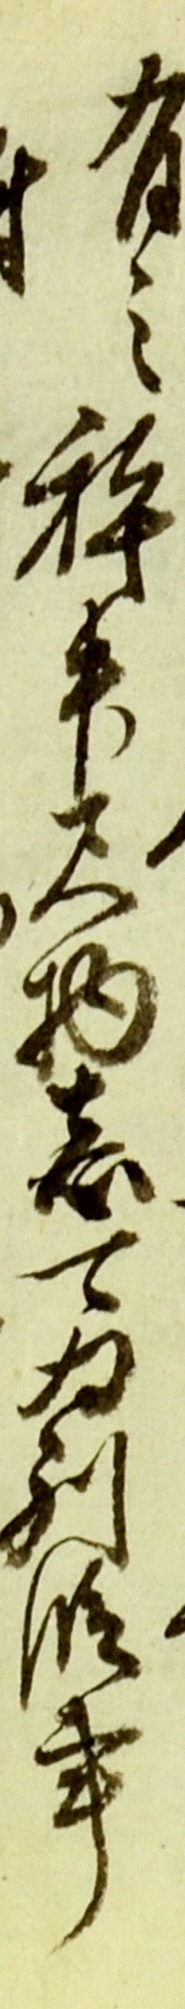有之秤升尺物者可為別段事
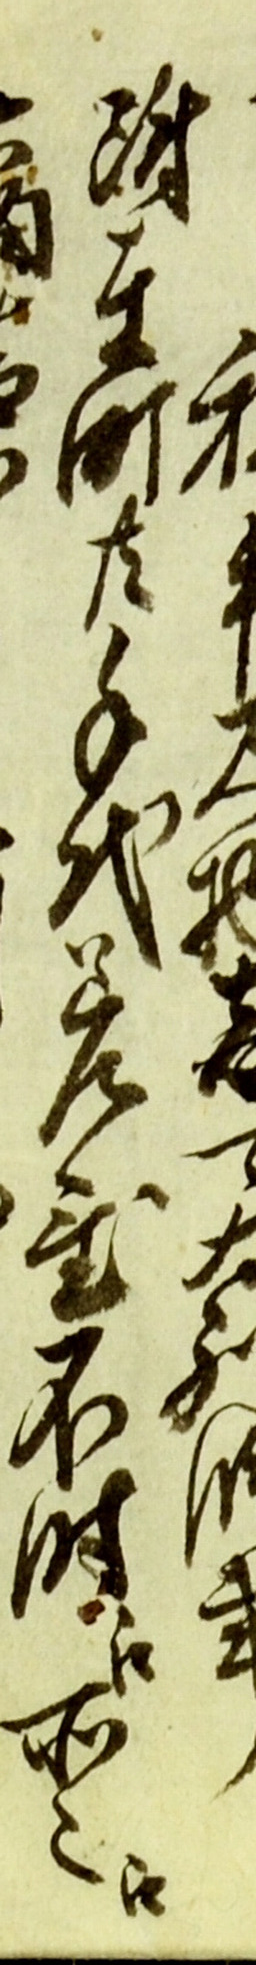附在町共手代差置不時江所々江
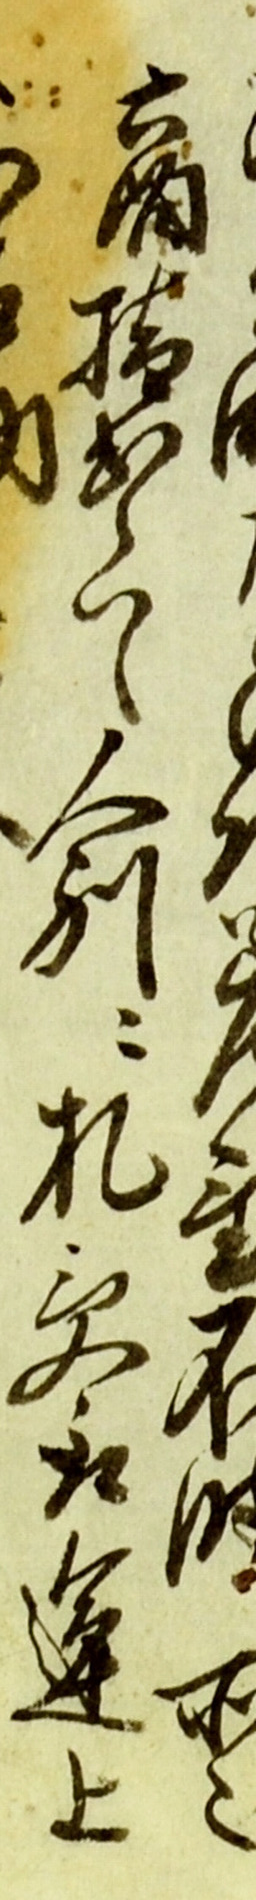商指出候ハゝ人別ニ札受取運上
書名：分一方諸運上御定法
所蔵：伊那市立高遠町図書館・合同会社AMANE
